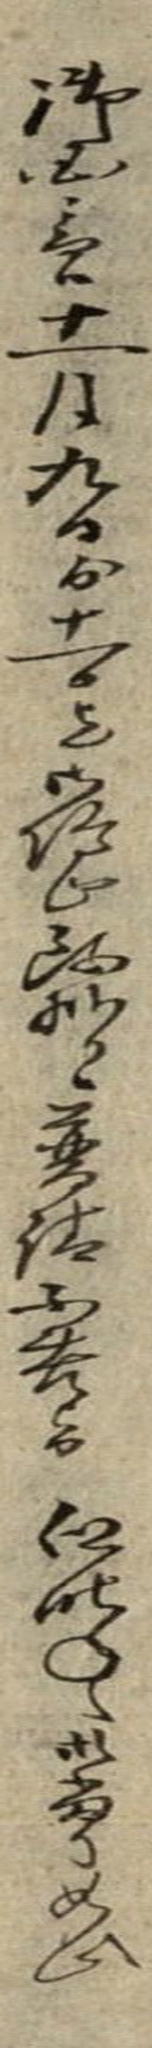御国にては十一月九日ゟ十一日迄御停止致掛り候普請不苦旨但昨年之御当り如此

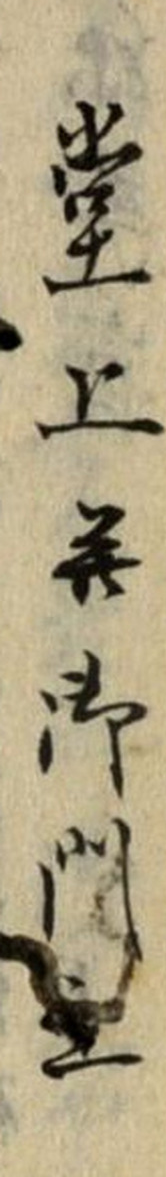堂上并御門主
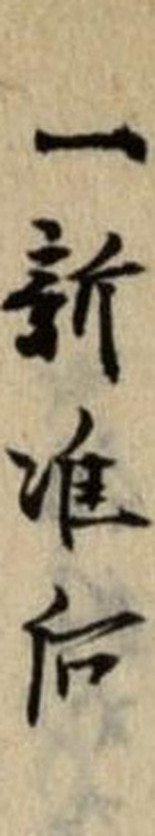一新准后
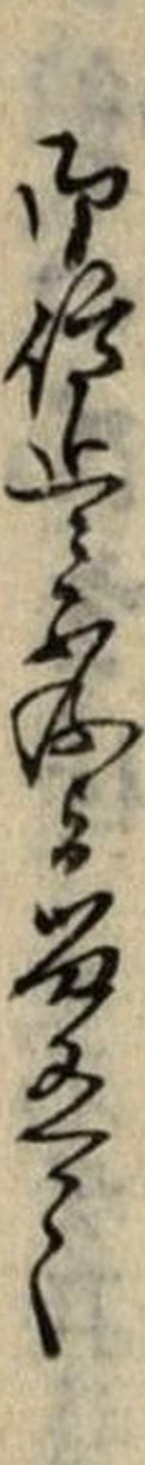御停止に不及旨留有之
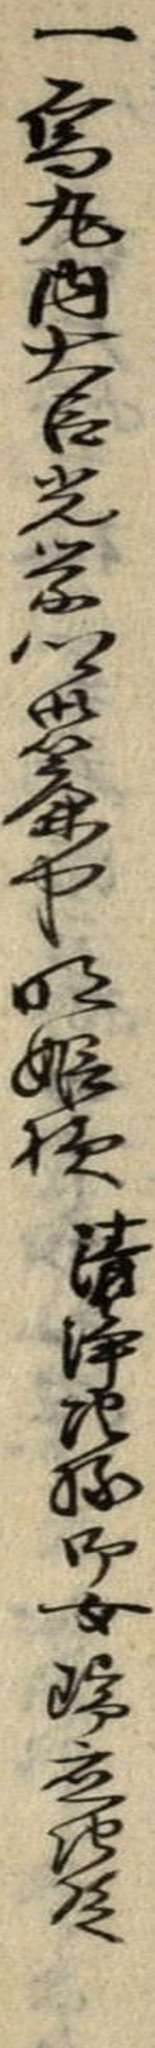一烏丸内大臣光栄卿御簾中明姫様清浄院様御女瑞応院殿
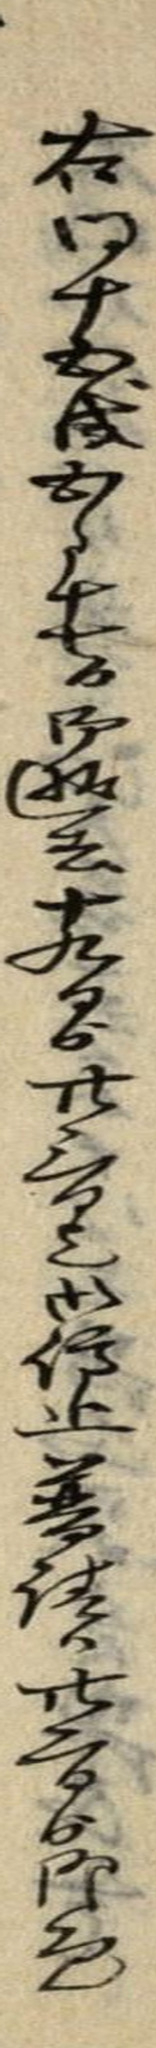右同十五戌五月十七日御逝去十九日ゟ廿三日迄御停止普請は廿二日ゟ御免
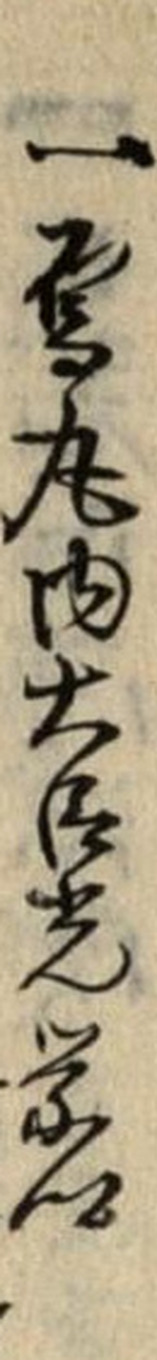一烏丸内大臣光栄卿
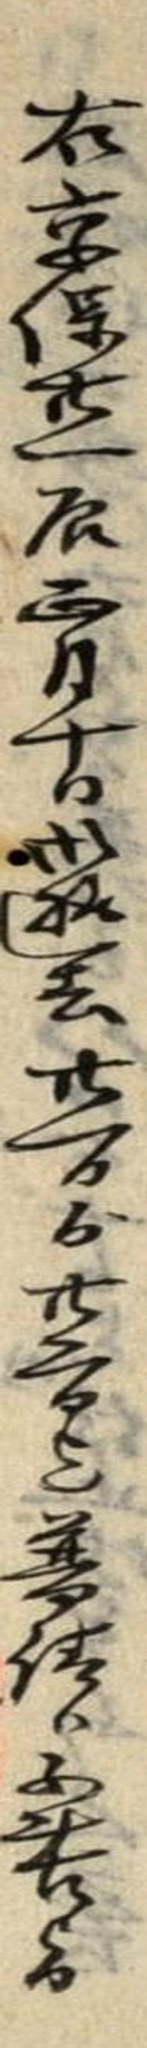右享保廿一辰正月十日御逝去廿一日ゟ廿二日迄普請は不苦旨
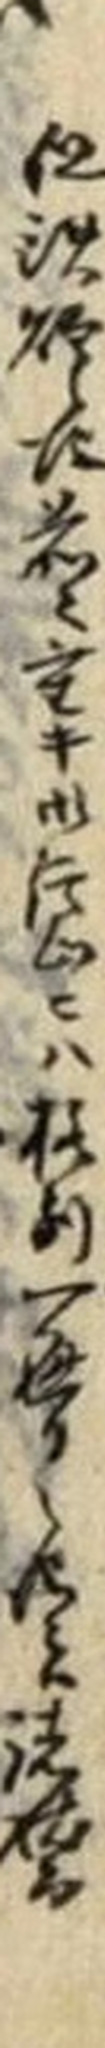但鉄炮之儀前々重キ御停止には格別一通り之儀には諸稽
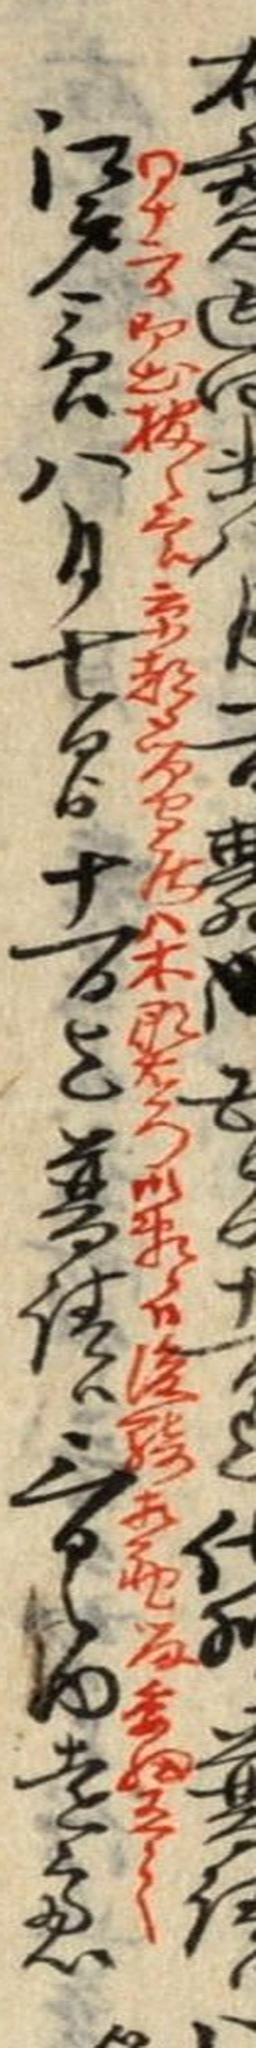江戸にては八月七日ゟ十一日迄普請は三日之内遠慮
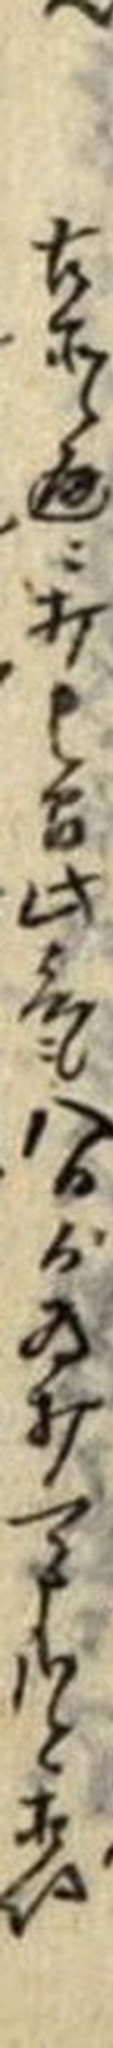古所之通に打申候間此度も八日ゟ為打可申哉と相伺
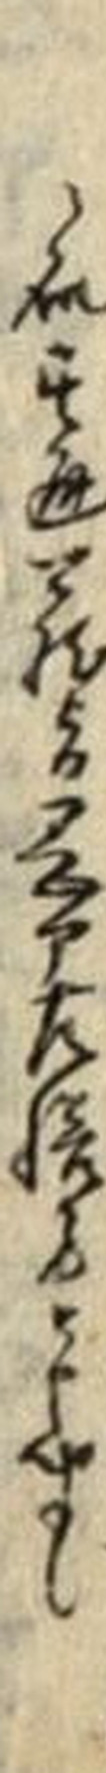候処其通可然旨岡部左膳方被申聞候
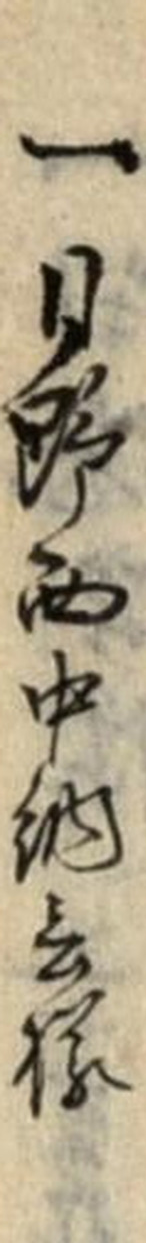一日野西中納言様
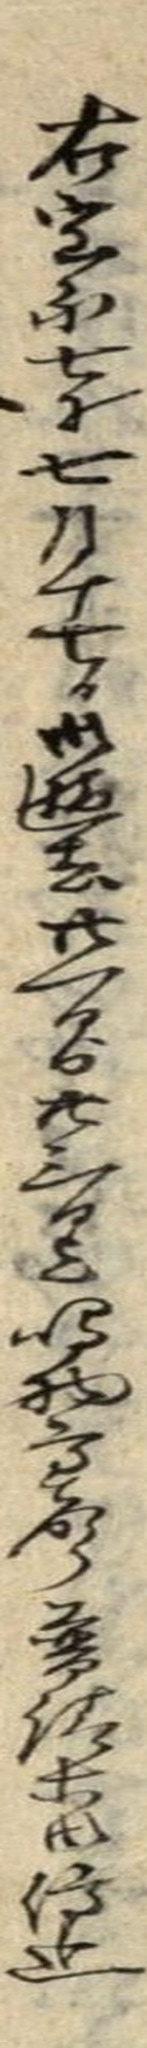右宝永七刁七月十七日御逝去廿一日ゟ廿三日迄鳴物高声普請等御停止
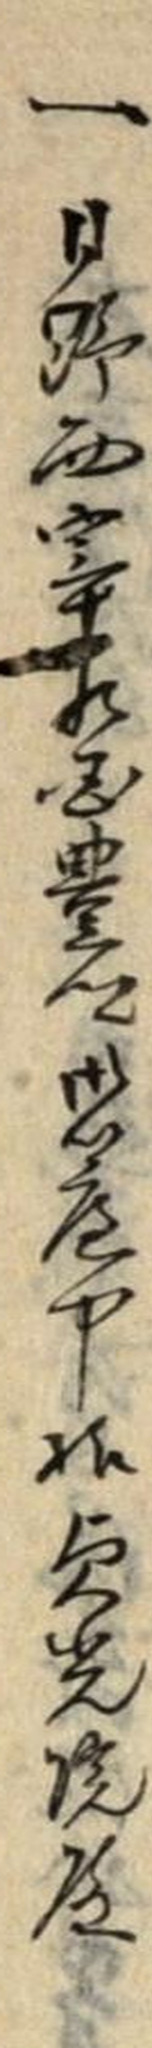一日野西宰相国豊卿御簾中様貞光院殿

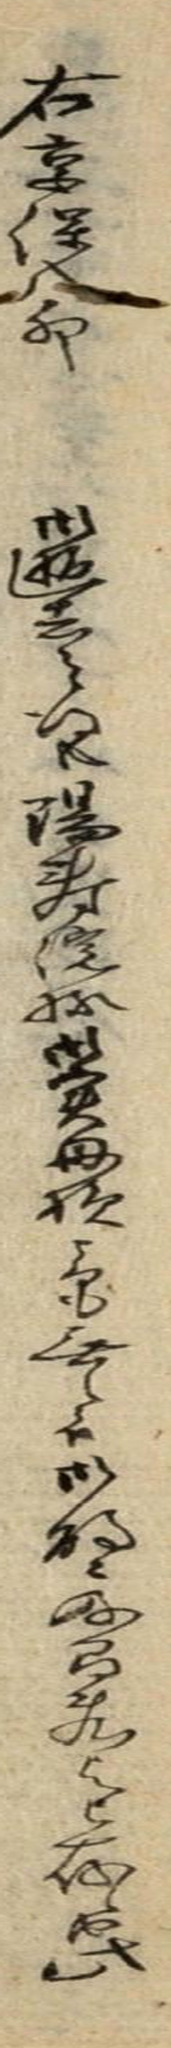右享保八卯御逝去に候得共陽寿院様御実母様にても無之に付御触に及間敷と被存候由此
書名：御停止異変死失
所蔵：福井県文書館 Fukui Prefectural Archives
